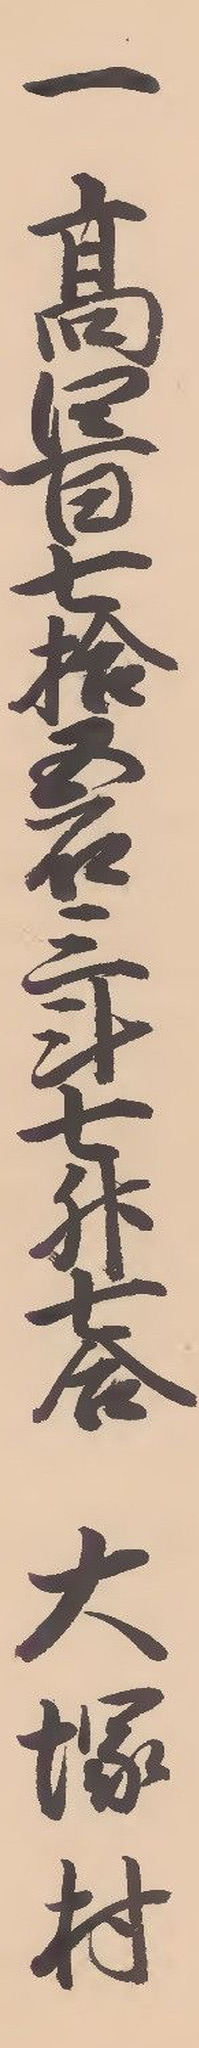一高四百七拾五石三斗七升七合大塚村

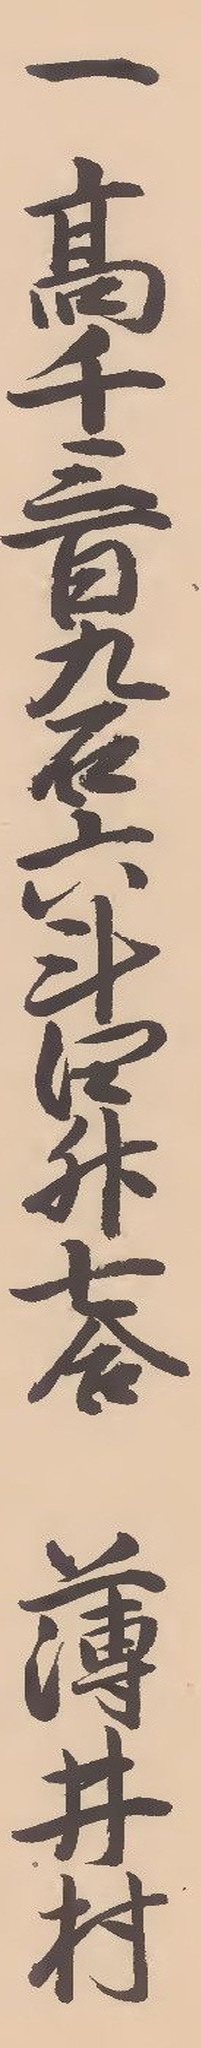一高千三百九石六斗四升七合薄井村
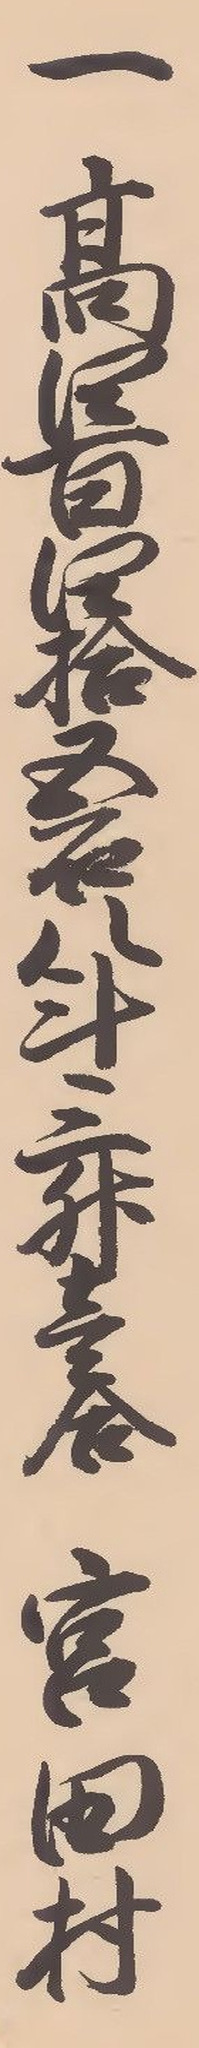一高四百四拾五石八斗三升壱合宮田村
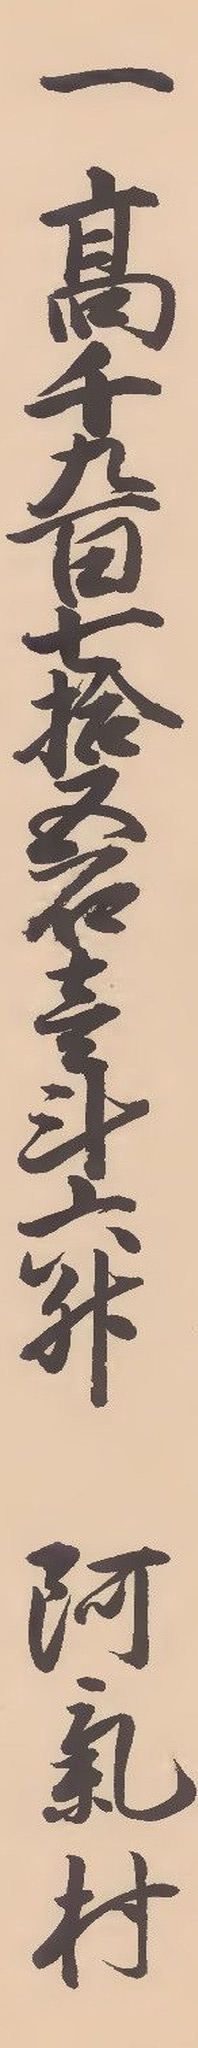一高千九百七拾五石壱斗六升阿気村
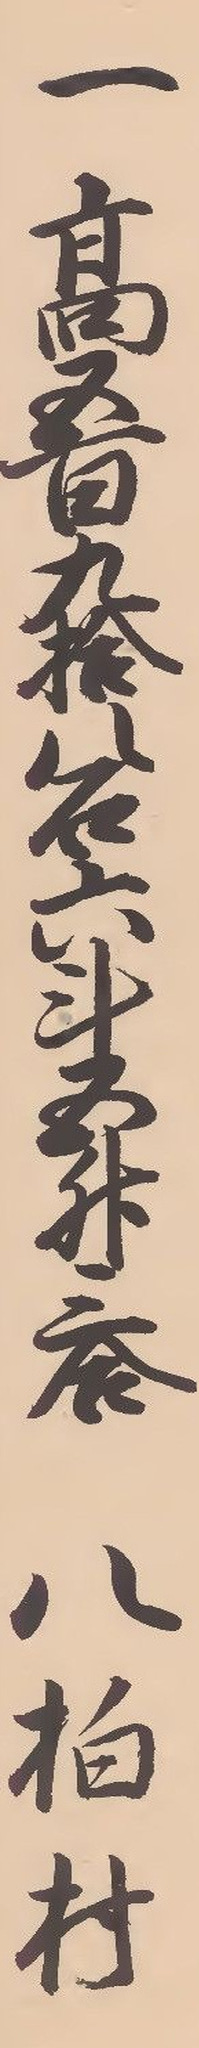一高五百九拾八石六斗五升三合八柏村
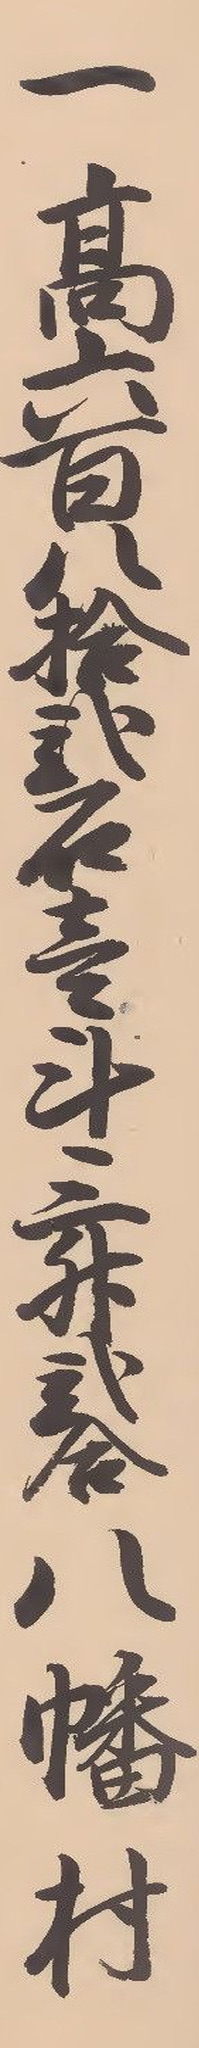一高六百八拾弐石壱斗三升弐合八幡村
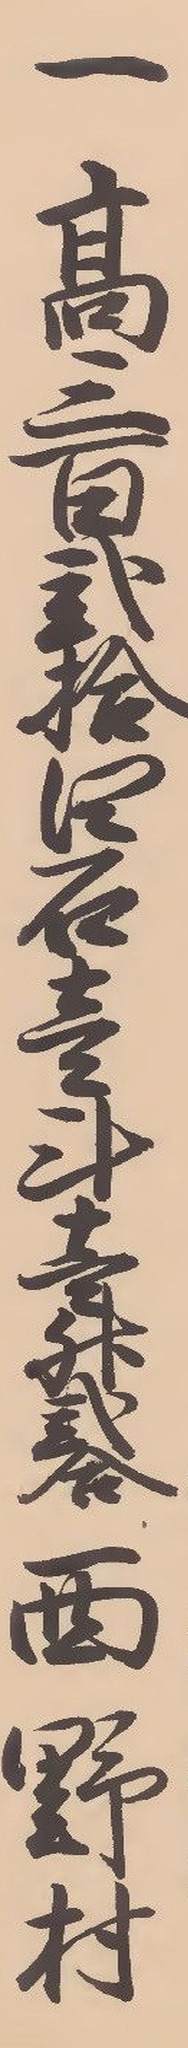一高三百弐拾四石壱斗壱升弐合西野村
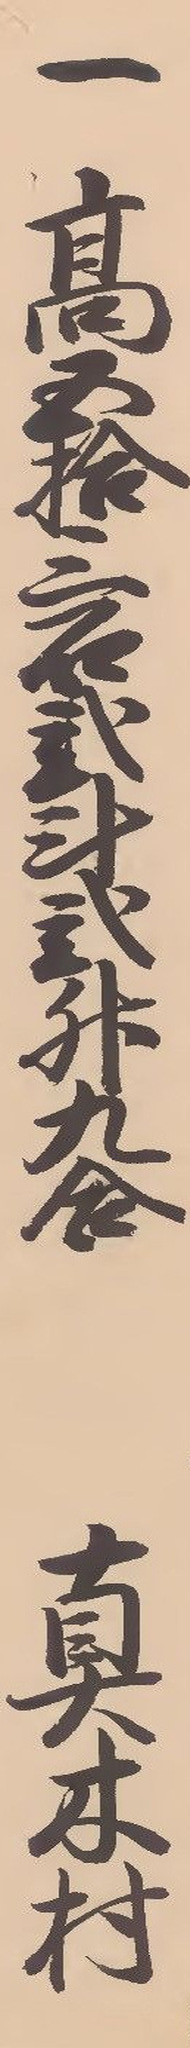一高五拾三石弐斗弐升九合真木村
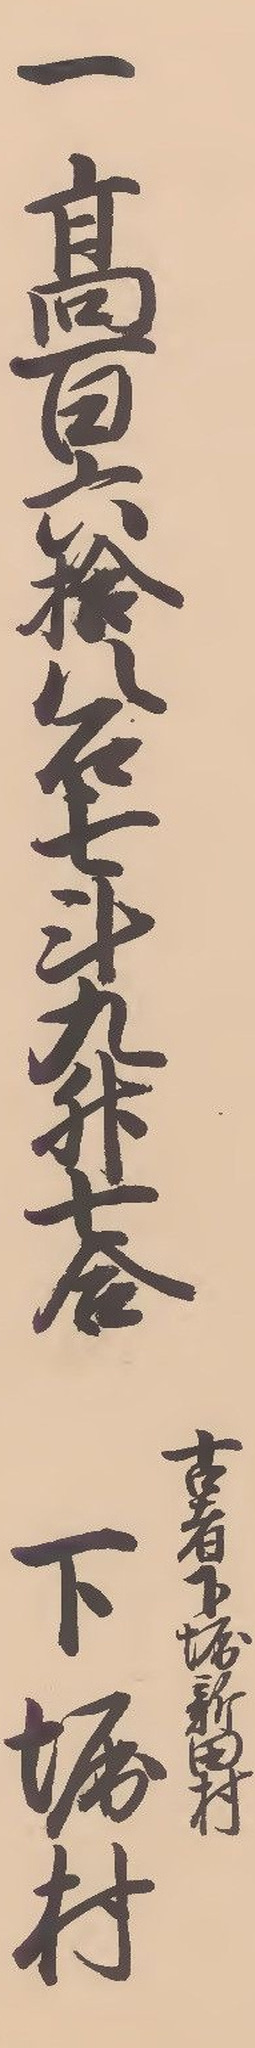一高百六拾八石七斗九升七合下堀村

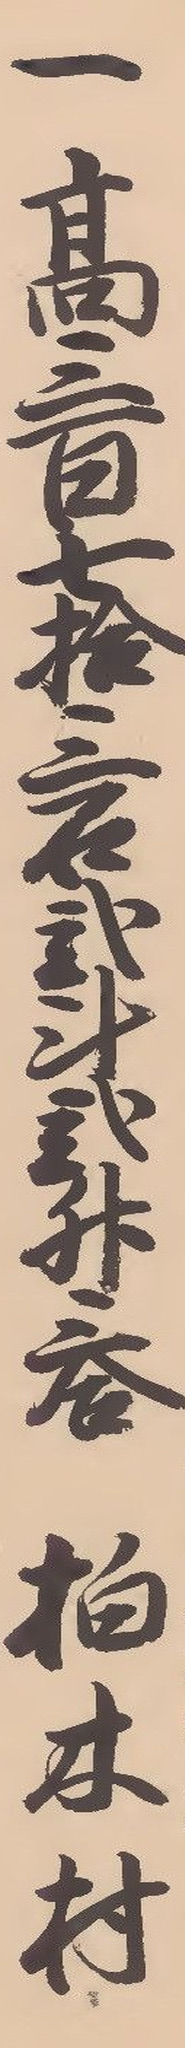一高三百七拾三石弐斗弐升三合柏木村
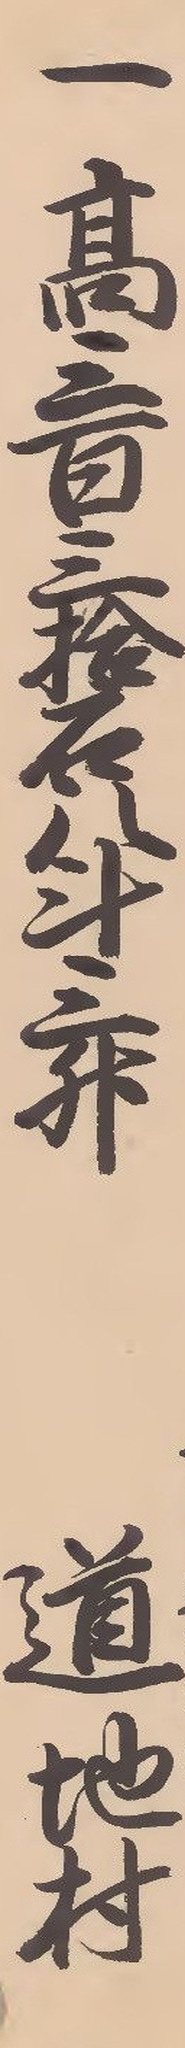一高三百三拾石八斗三升道地村
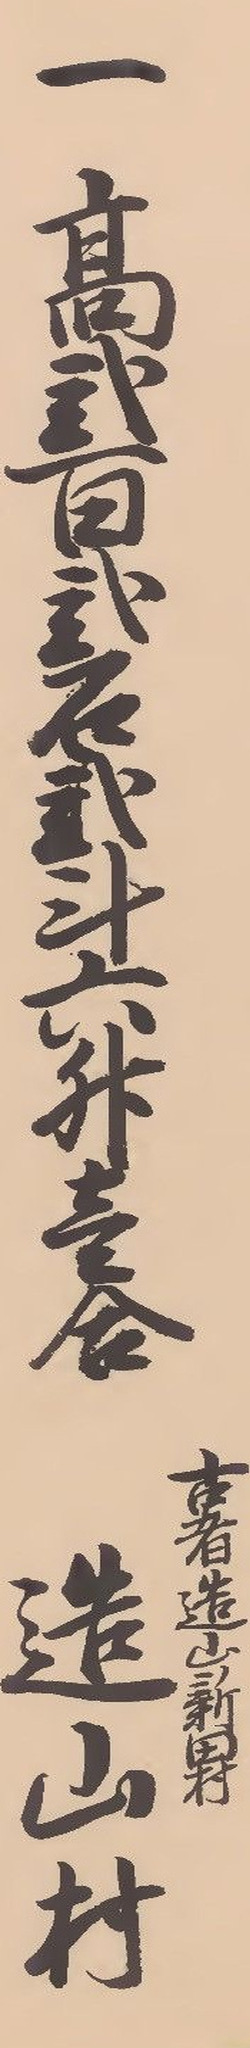一高弐百弐石弐斗六升壱合造山村
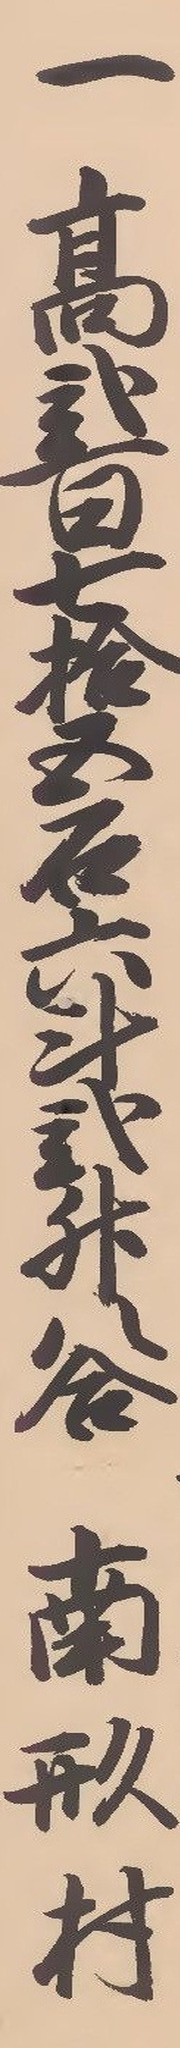一高弐百七拾五石六斗弐升八合南形村
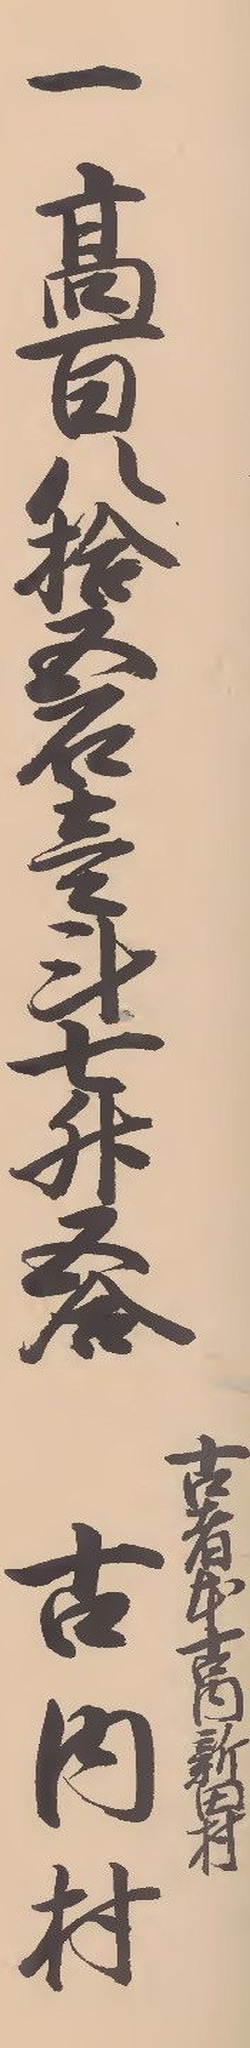一高百八拾五石壱斗七升五合古内村
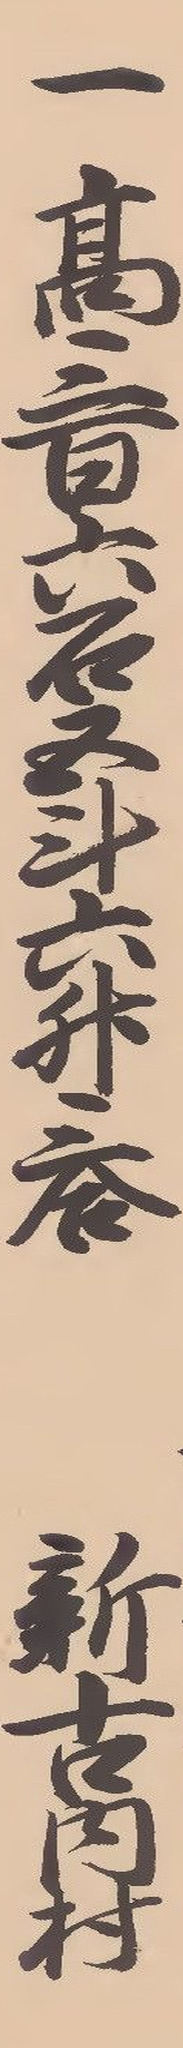一高三百六石五斗六升三合新古内村
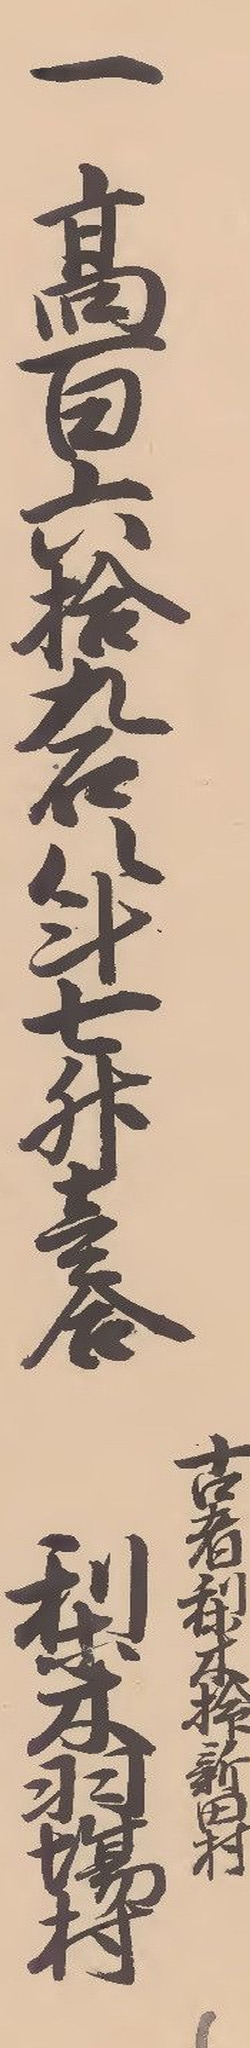一高百六拾九石八斗七升壱合梨木羽場村
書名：出羽国郷帳　５
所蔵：国立公文書館 National Archives of Japan
